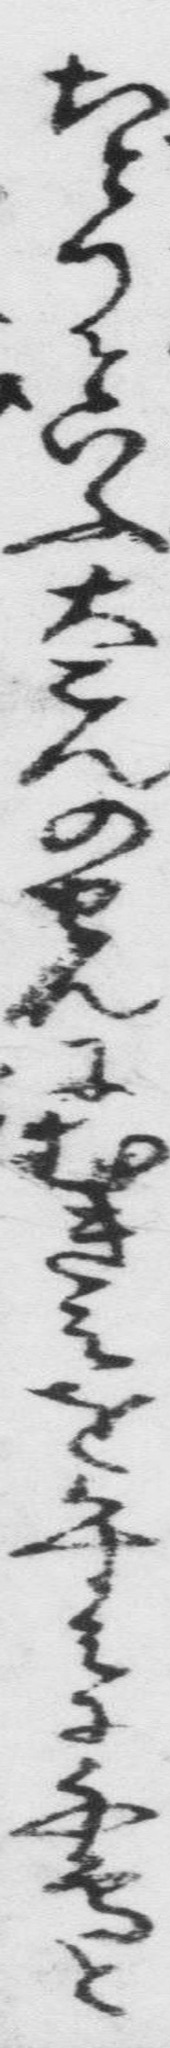ちどりといふ大こんのせんにむきみをかすみに千鳥と
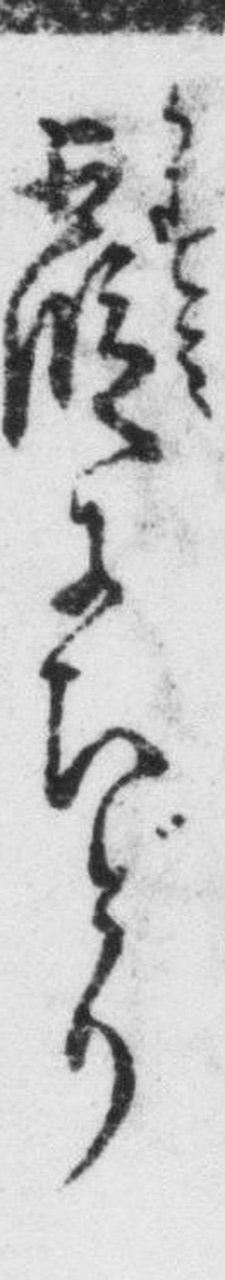霞にちどり
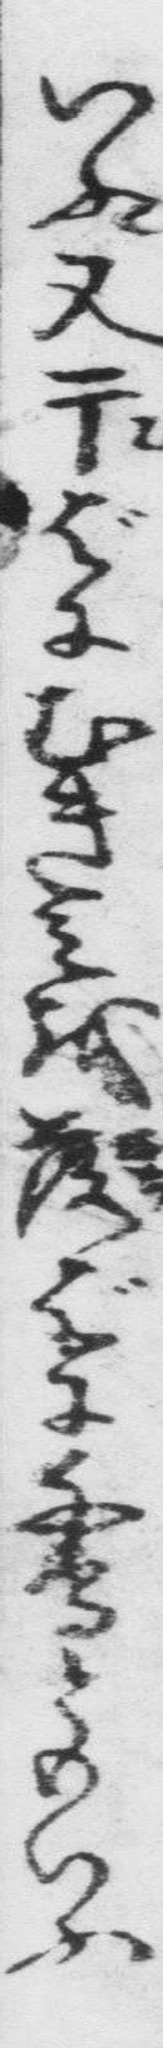いふ又干ばにむきみを落ば千鳥ともいふ
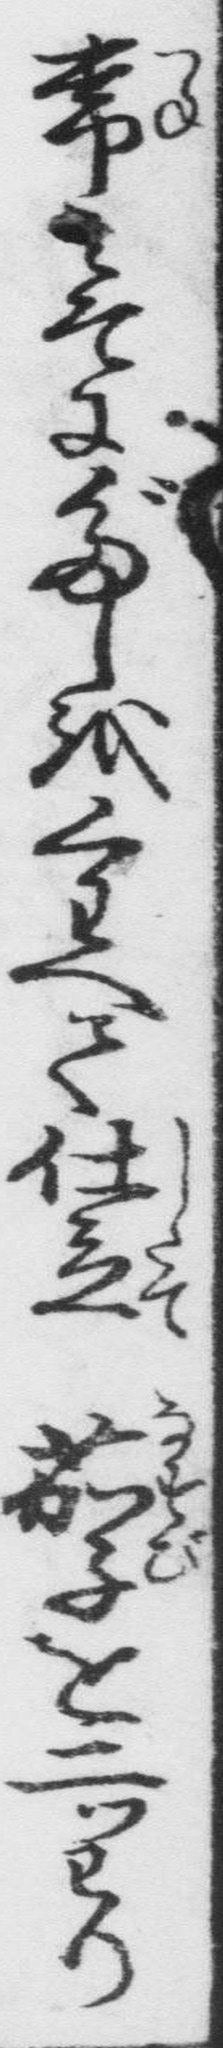常みそにだしをくわへて仕立茄子を二つわり
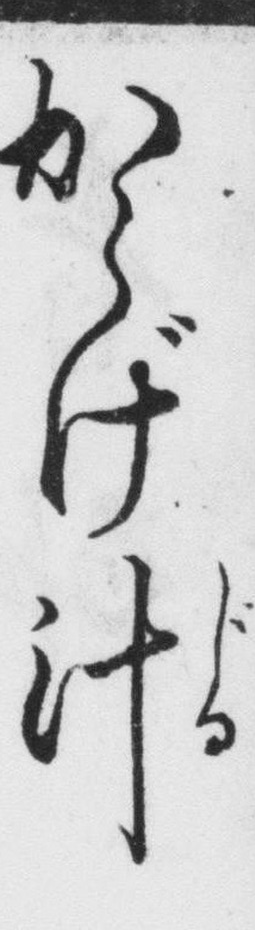からげ汁
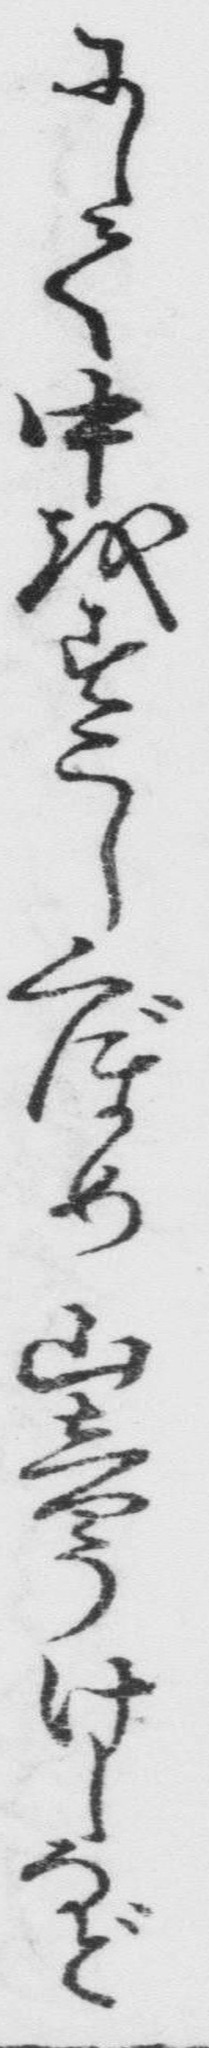にて中をすこしくぼめ山しやうけしなど
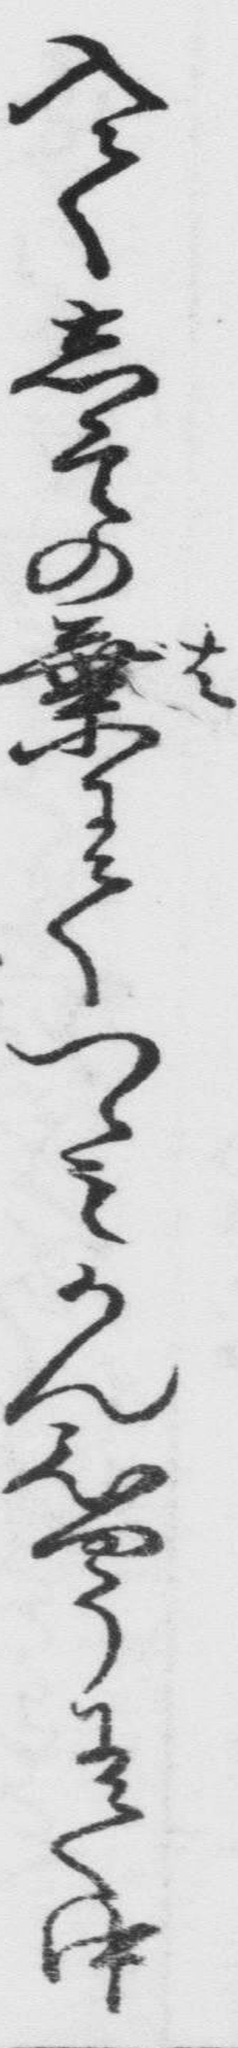入てしその葉にてつゝみかんひやうにて中
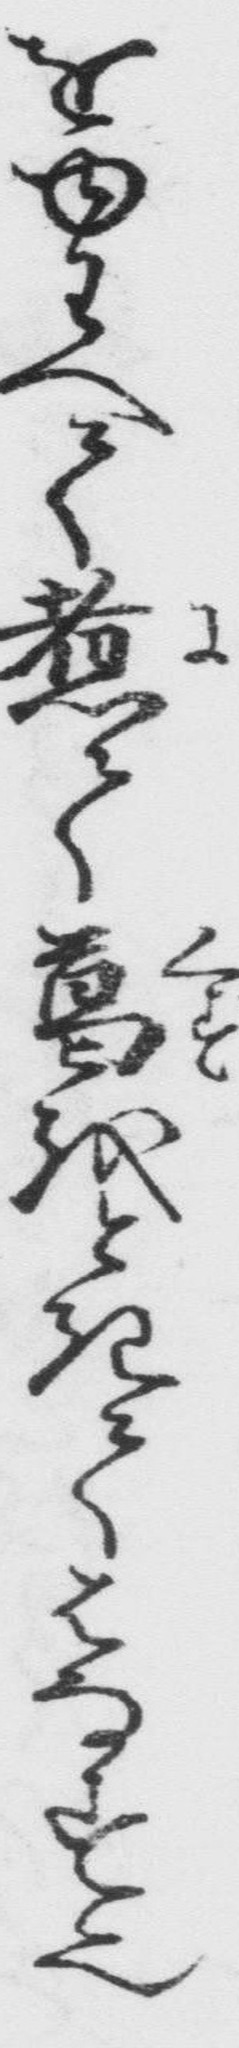をゆわへて煮て葛をときてはなす也
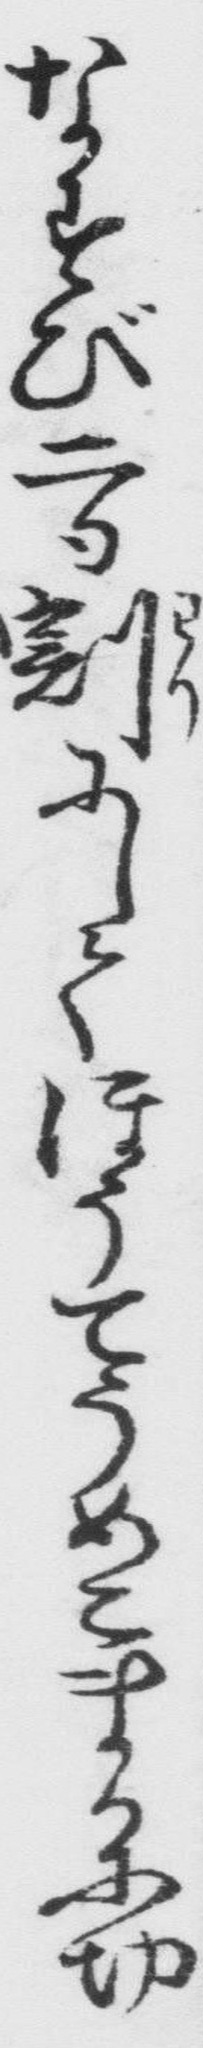なすび二つ割にしてほうてうめこまかに切
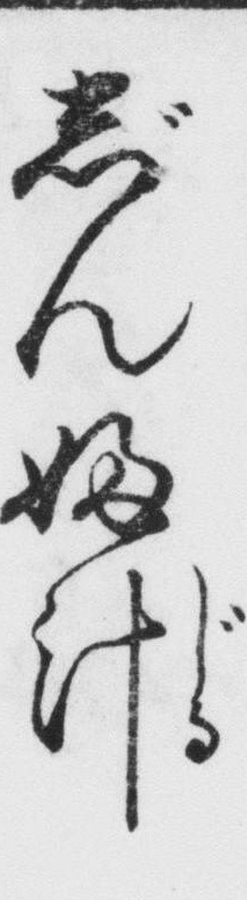じんふ汁
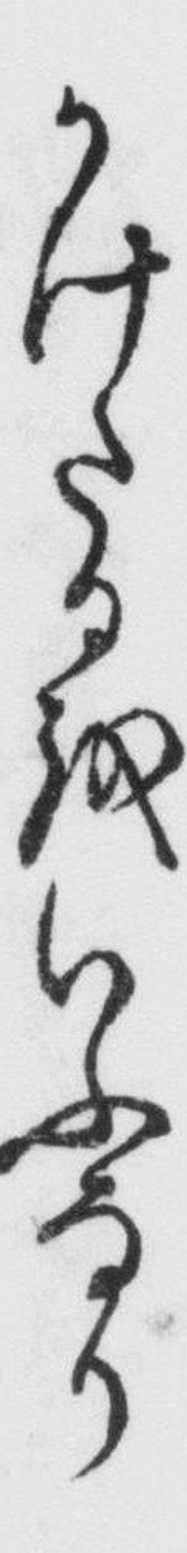かけたるをいふなり
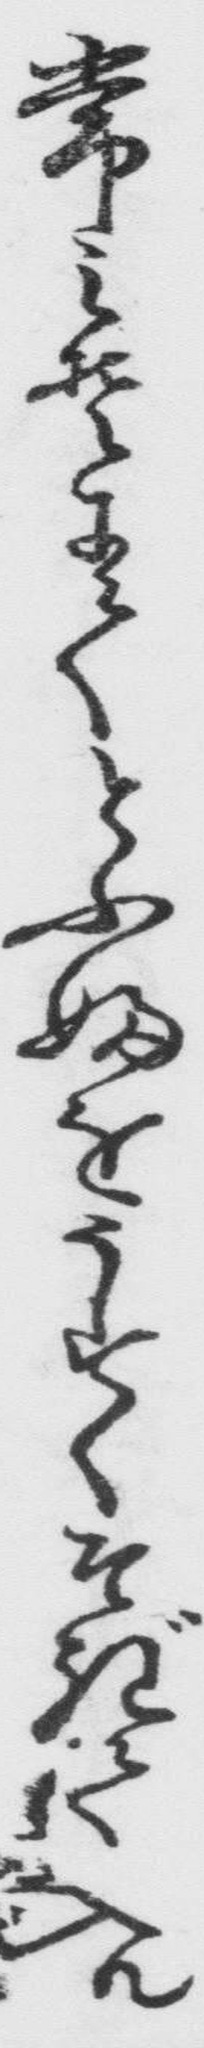常みそにてとふふをうすくそぎて入る
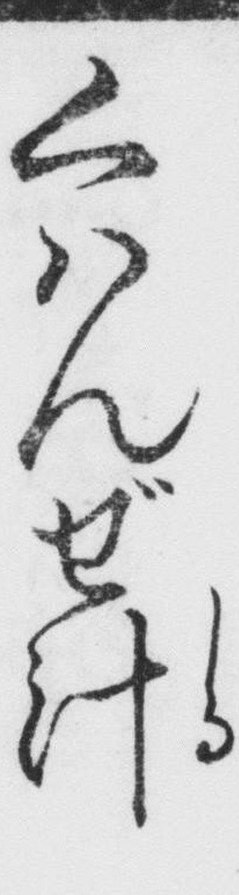くはんぜ汁
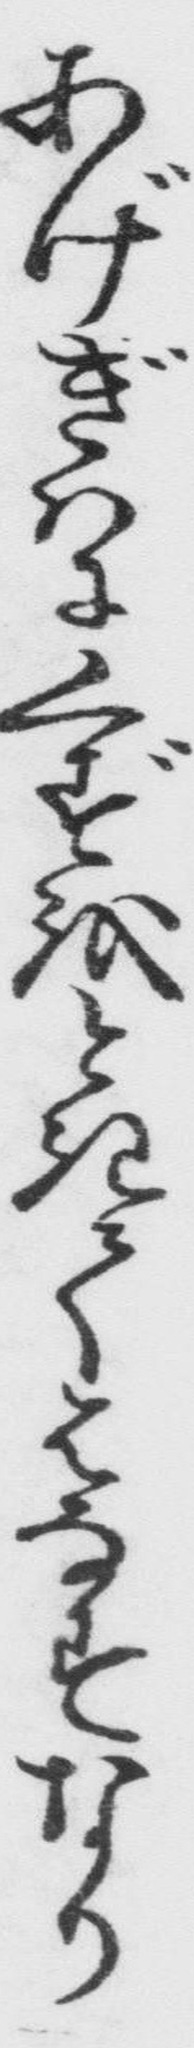あげぎはにくずをときてはなすなり
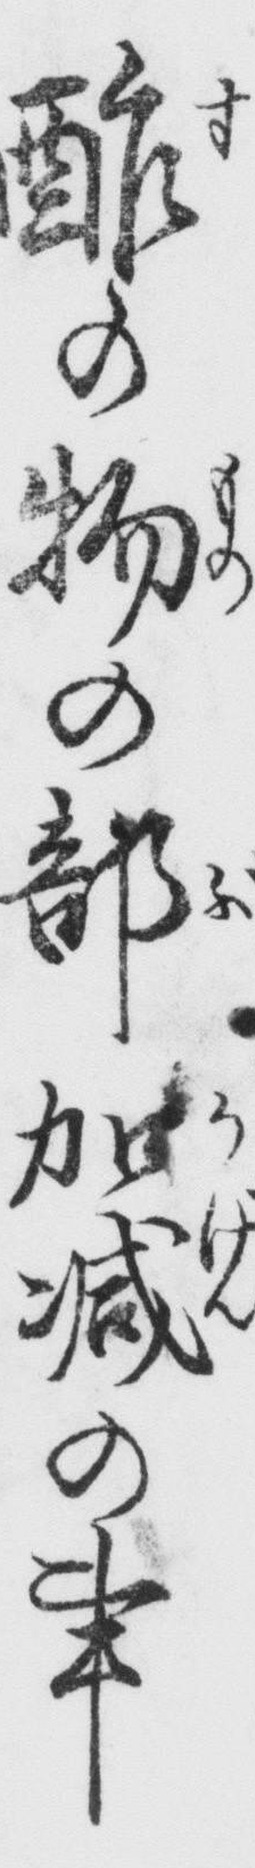酢の物の部加減の事
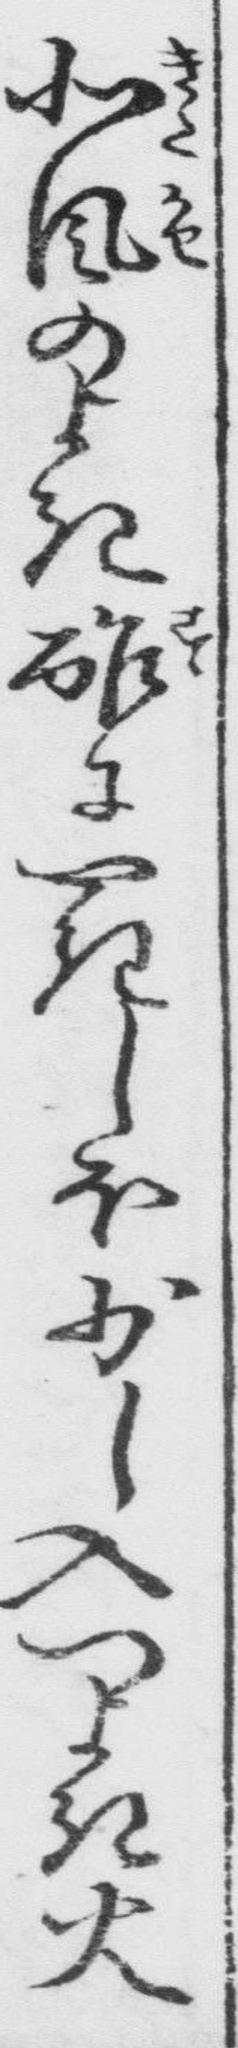北風のよき酢にやきしほ少し入れつよき火
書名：料理早指南
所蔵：大阪府立大学学術情報センター 国文学研究資料館
